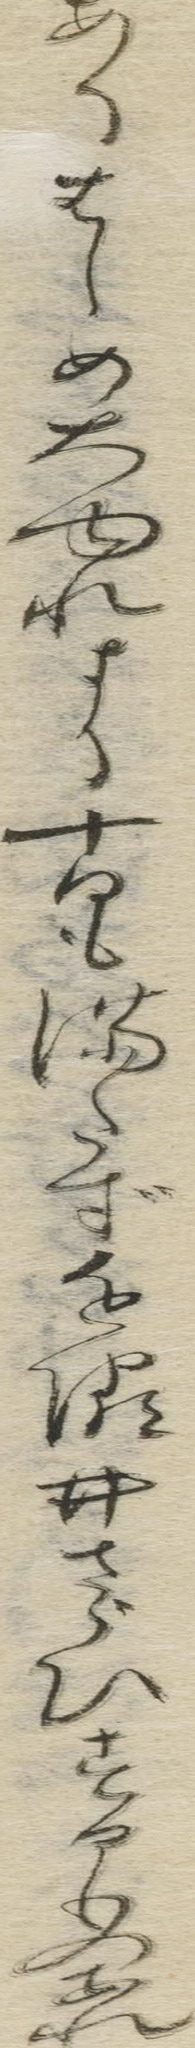ありはしめ大ゆれより十日もまたず近隣井さらひするものあれ
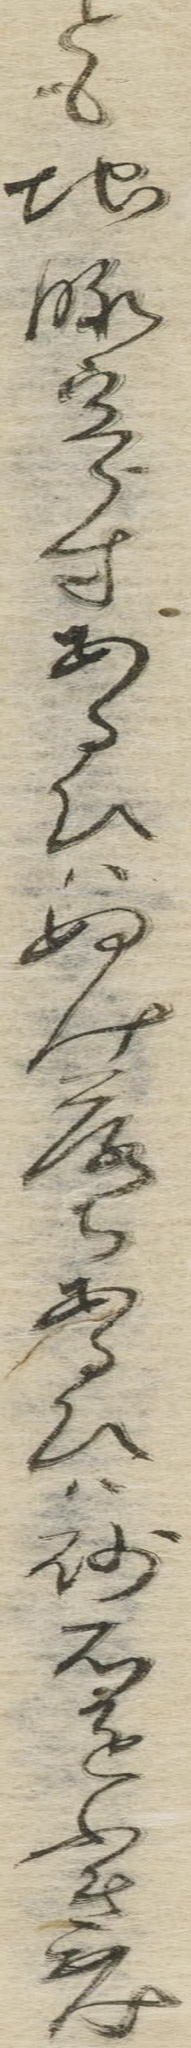とも地脈定らすあるひハぬけ落ちあるひハ砂石をふきつけ
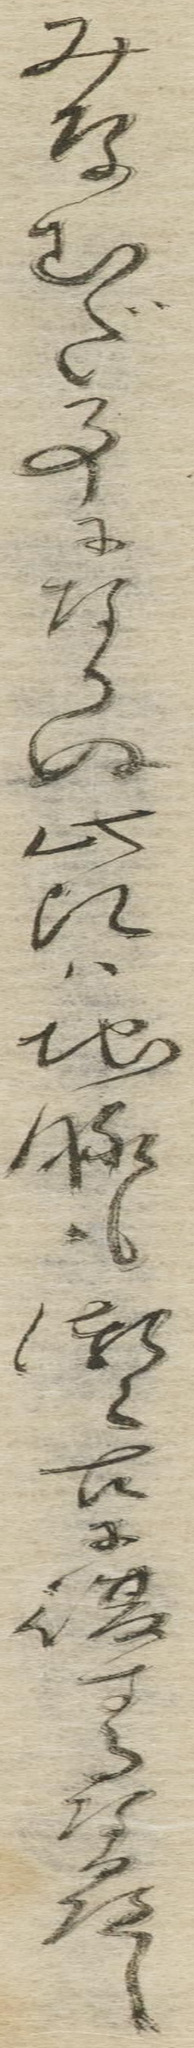みなむだ事になりぬ此の頃ハ地脈も漸く古に復するなるへし
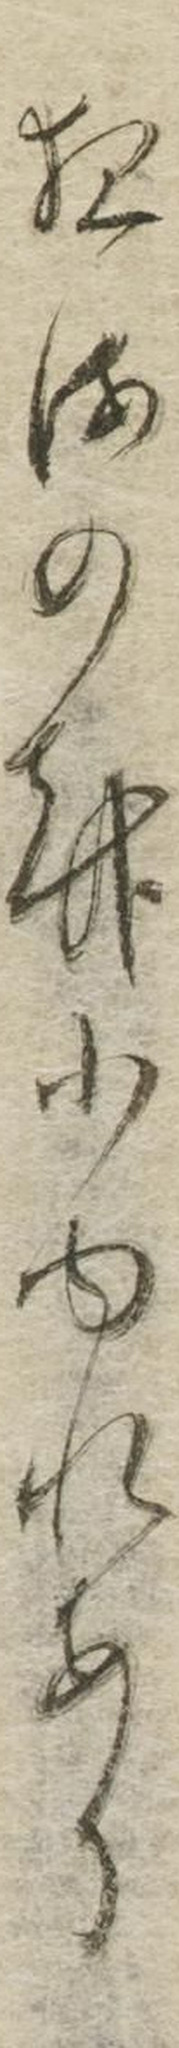夜戌の刻小ゆれあり
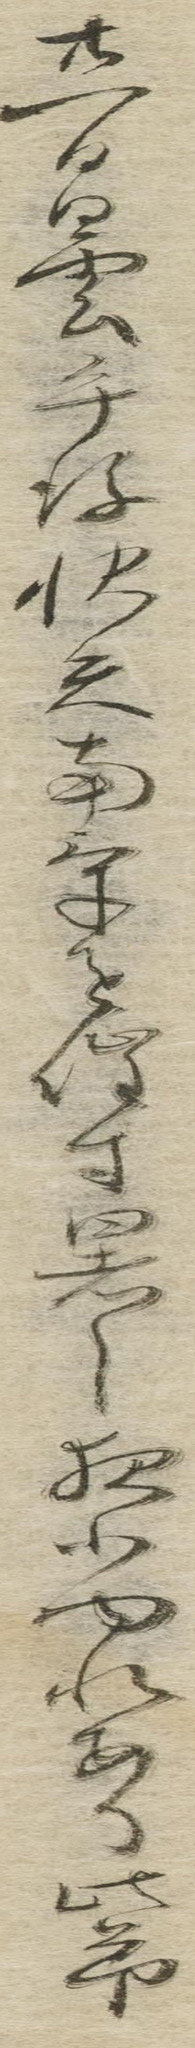廿一日曇午後快天南気を催す暑し夜小ゆれあり此節
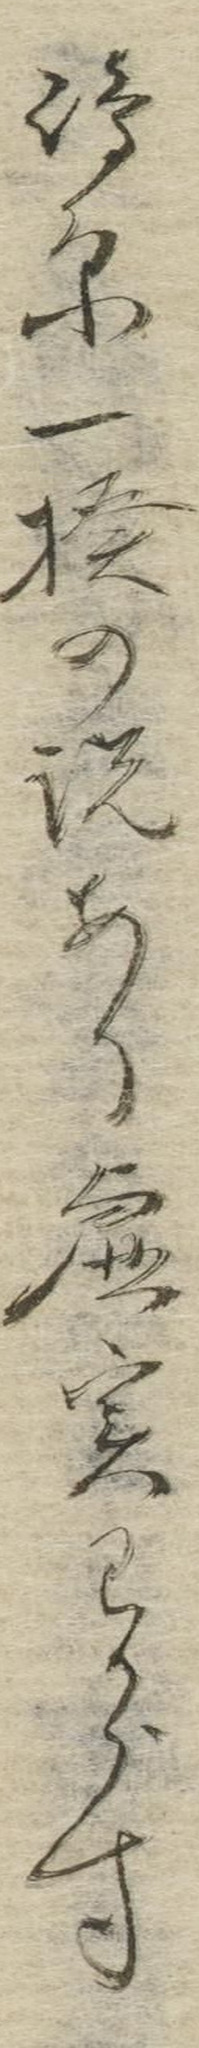嶋原一揆の説あり虚実わからす

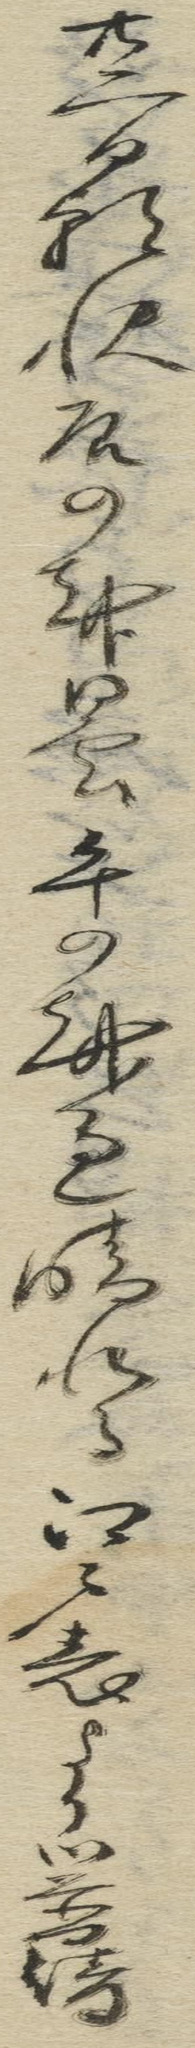廿二日朝快辰の刻曇午の刻過晴れる江戸表より御普請
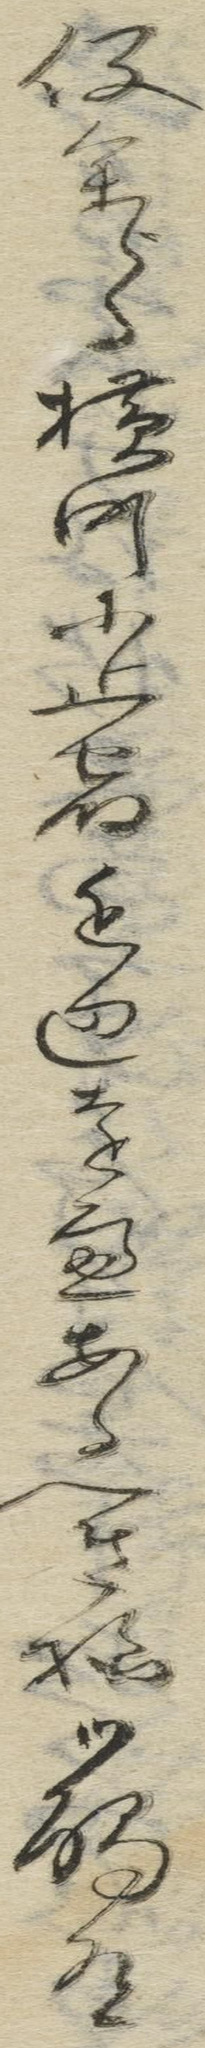役参らる横町に止宿近辺を通あるへき様御触有
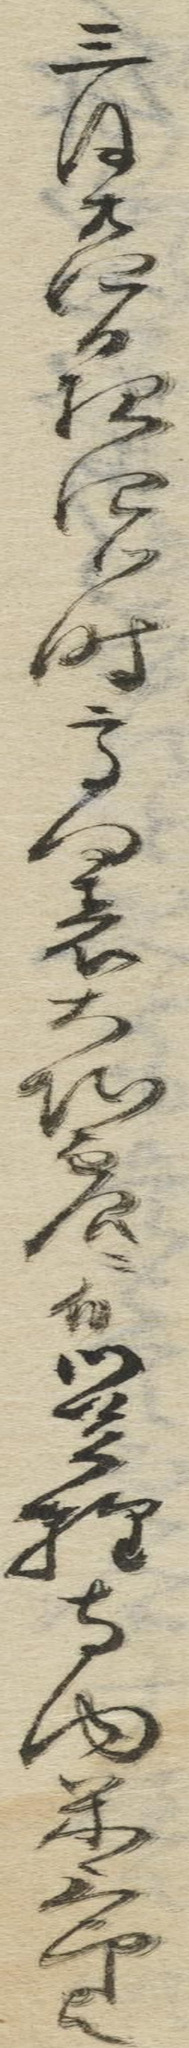三月廿四日夜四ッ時高岡表大地震二付御足軽寺内米三郎と
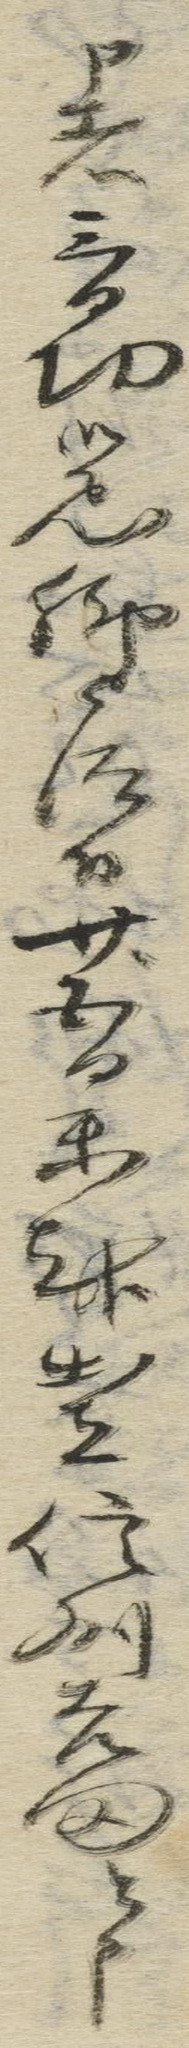申者三日切御飛脚被仰付廿五日未刻出立信州吉田と申
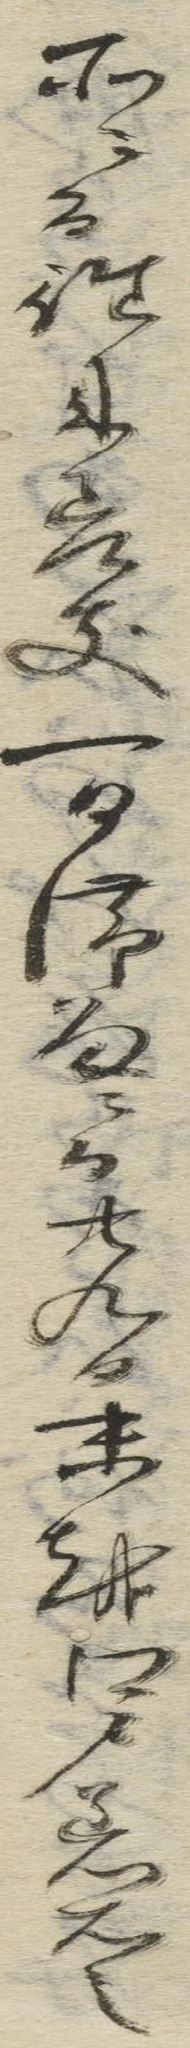所二而往来差支一日滞留二而廿九日未刻江戸着右之
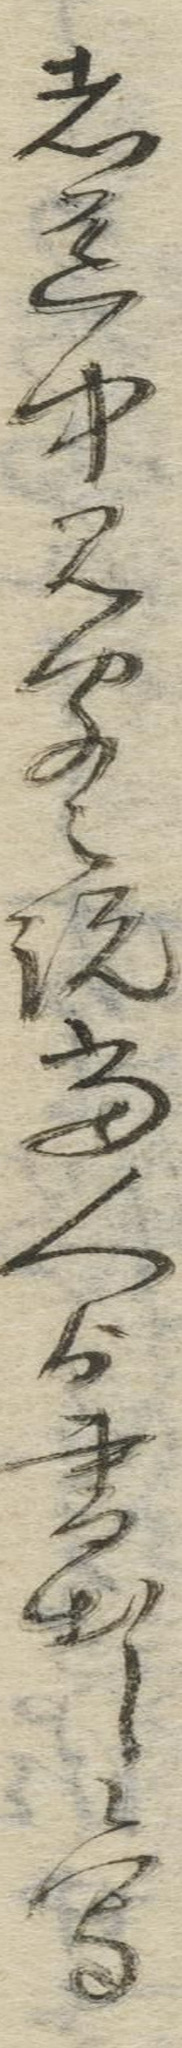者道中見分之説当人ゟ書出し候写
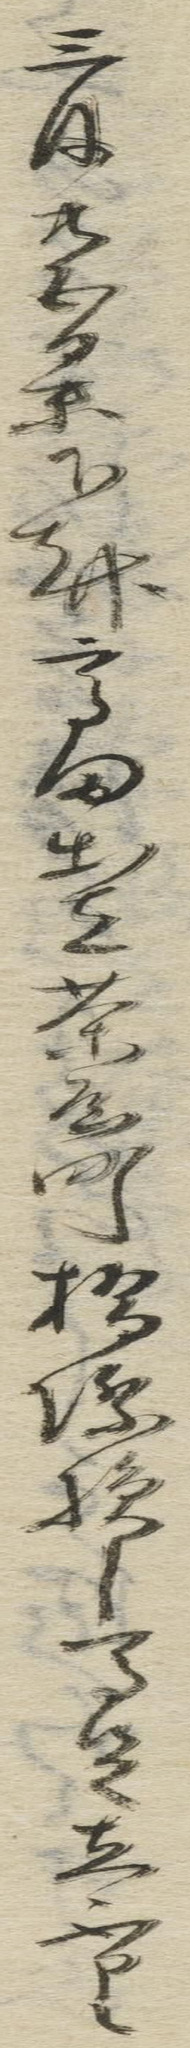三月廿五日未下刻高田出立茶屋町橋際損し馬足立不申候
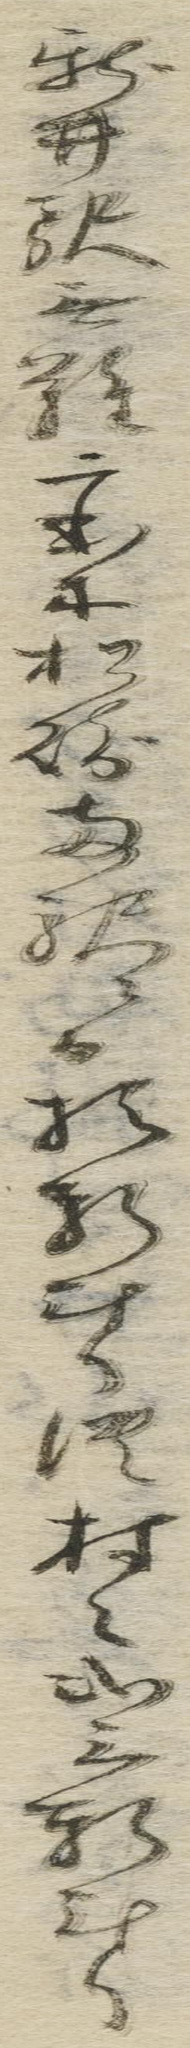新井駅無難二本木松崎両駅二而拾軒計り潰村々弐三軒計り
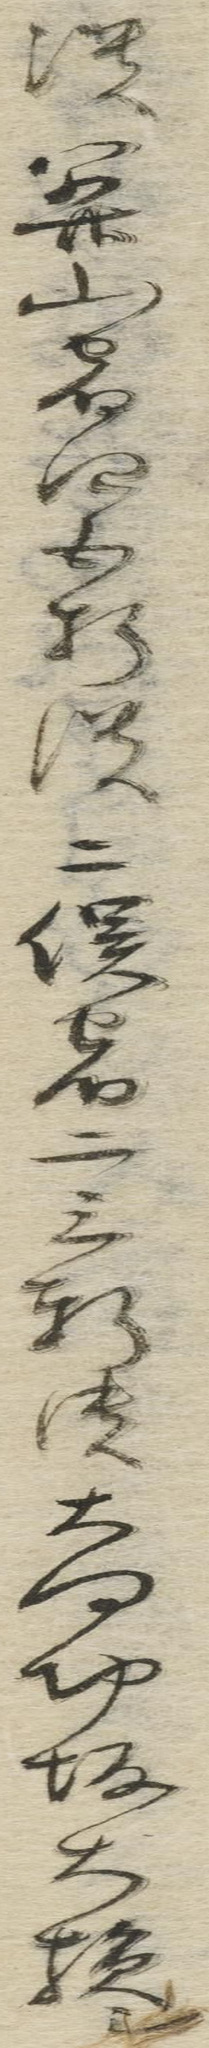潰関山宿四五軒潰二俣宿二三軒潰大田切坂大損ㇱ
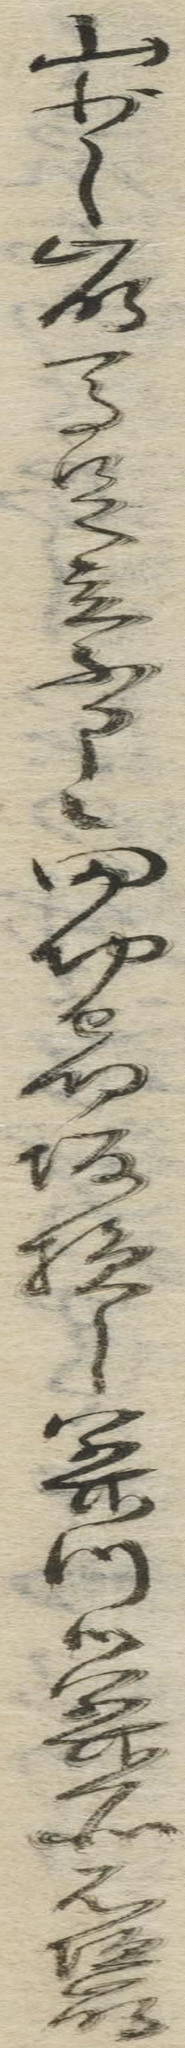山少し崩馬足立不申候田切宿坂損し関川御関所石垣崩
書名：弘化丁未天變日記
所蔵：東京大学地震研究所図書室 Earthquake Research Institute Library, The University of Tokyo, JAPAN
